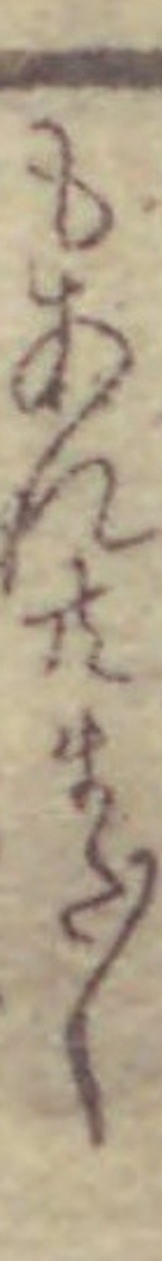もあれ共まだ〳〵
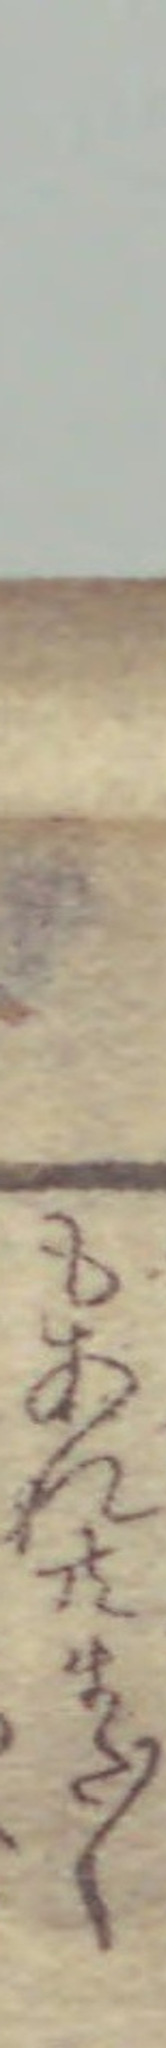もあれ共まだ〳〵
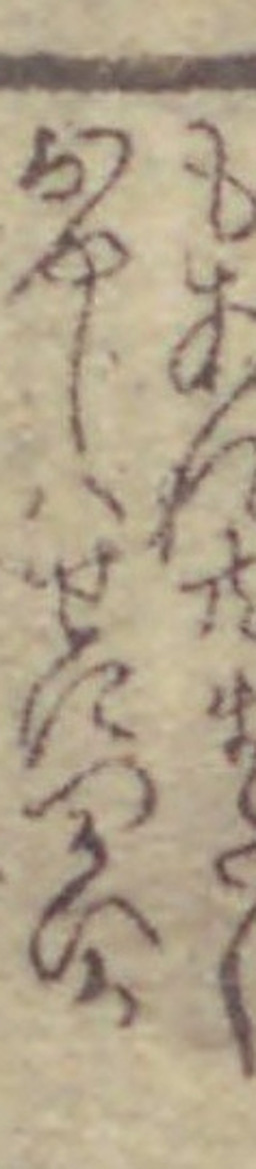おやしはせにつかいか
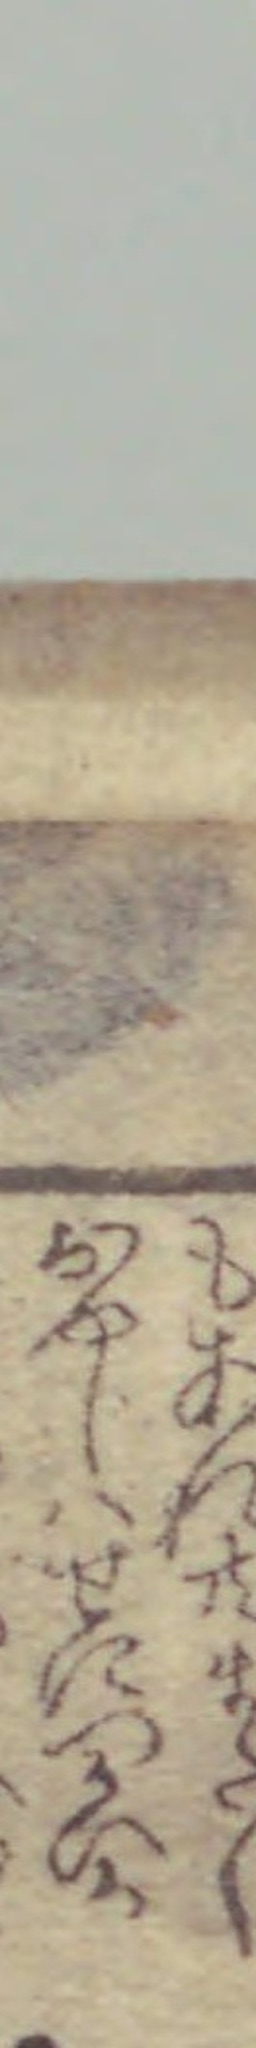おやしはせにつかいか
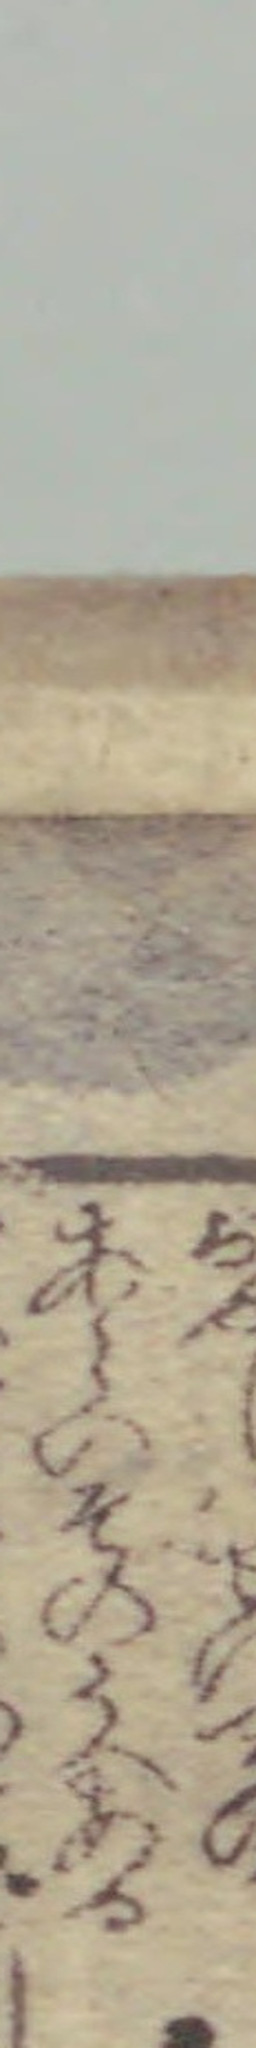あらいそのうへある
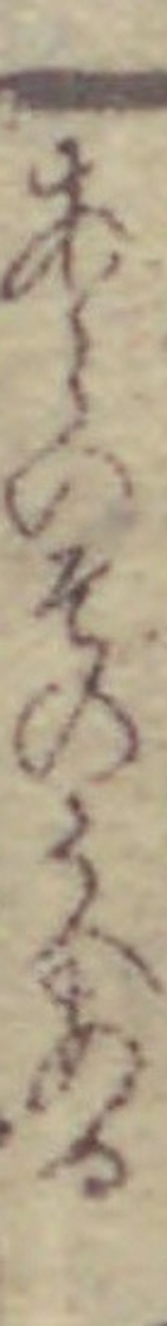あらいそのうへある
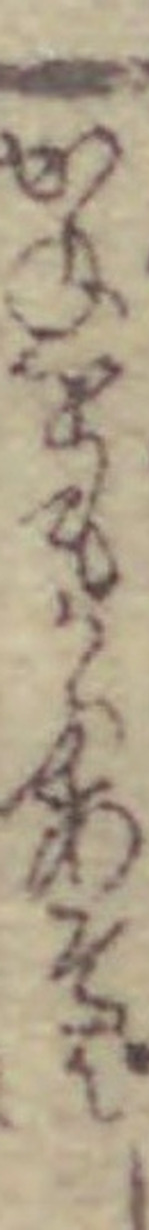かねをもかふあそは
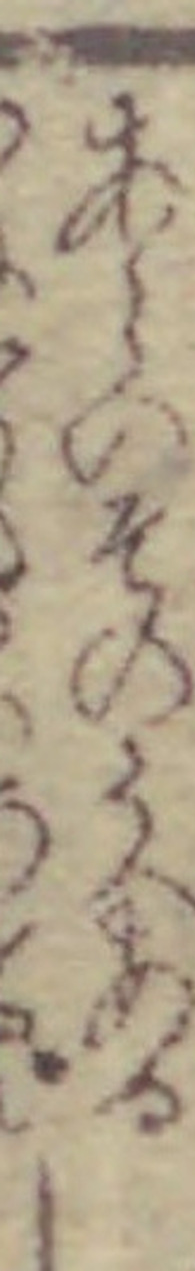あらいそのうへある
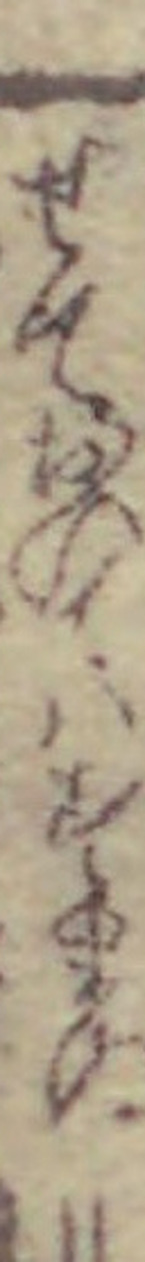せておいてはすまぬ
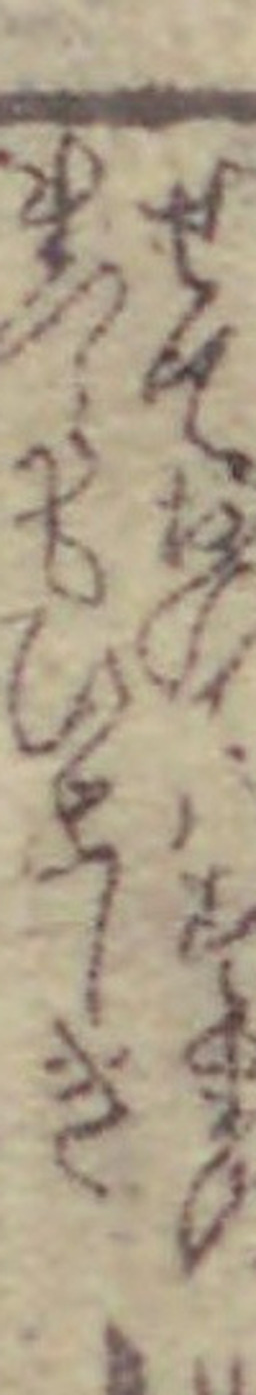まくらもひとゝき
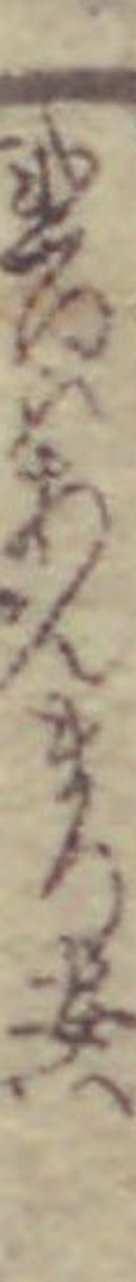弐百はあんまり安い
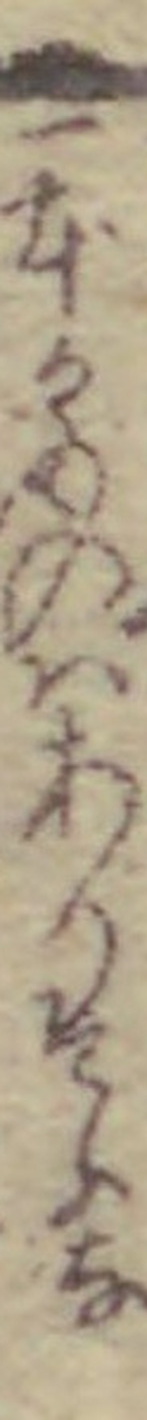一本かものはありそふな
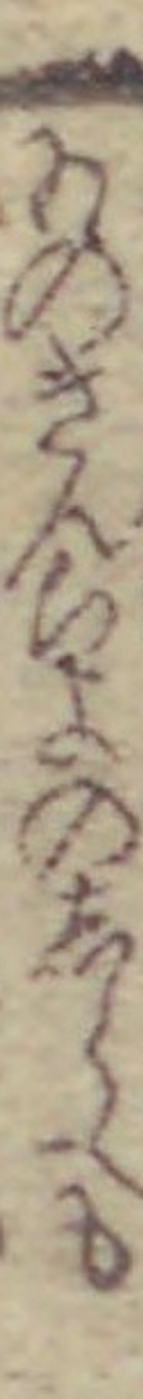ものきんちよのしうへも
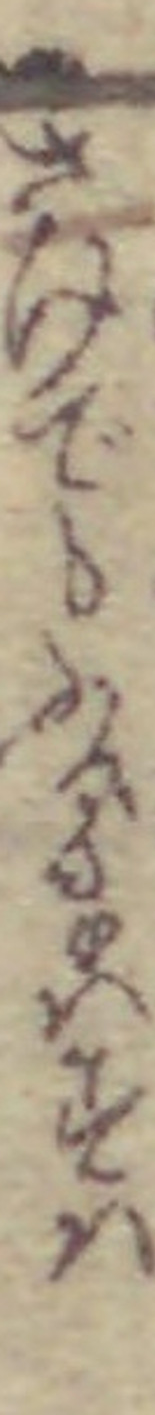さけでもふるまはすは
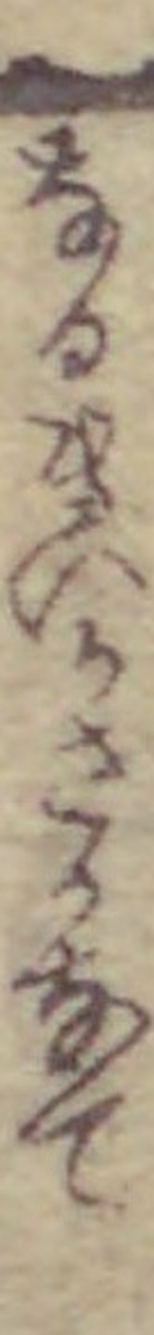なるまいかさかなて
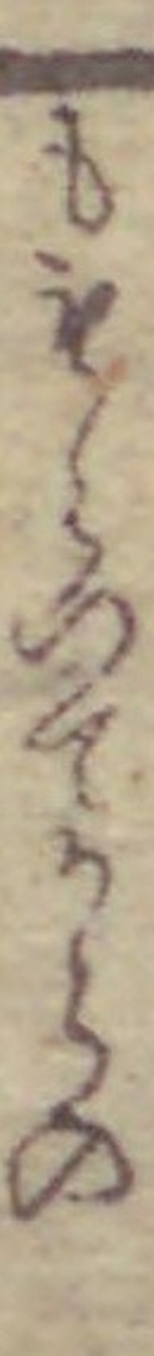ももらつてからの
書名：思事夢濃枕 3巻
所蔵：国立国会図書館 National Diet Library, JAPAN
